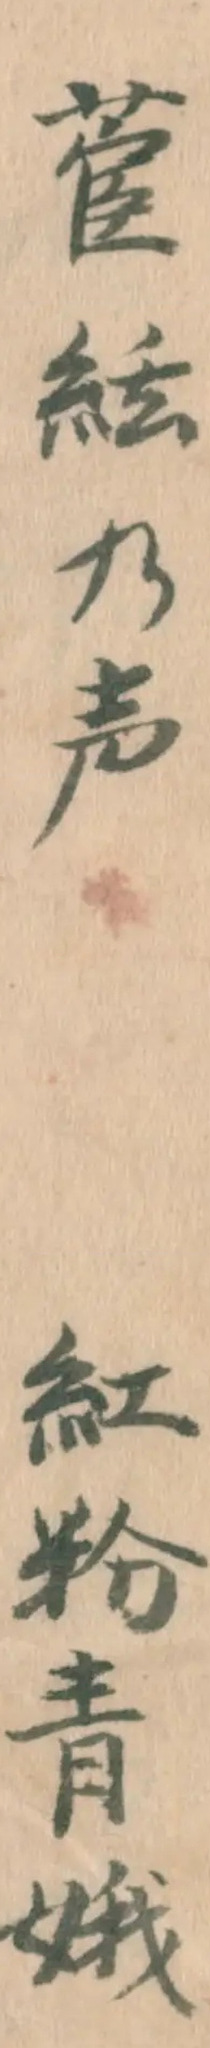管弦絃の声紅粉青娥
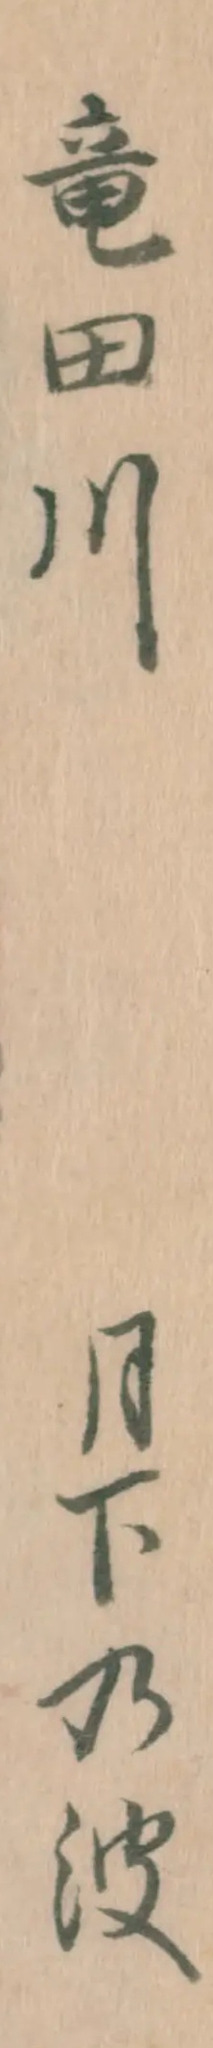竜田川月下の波

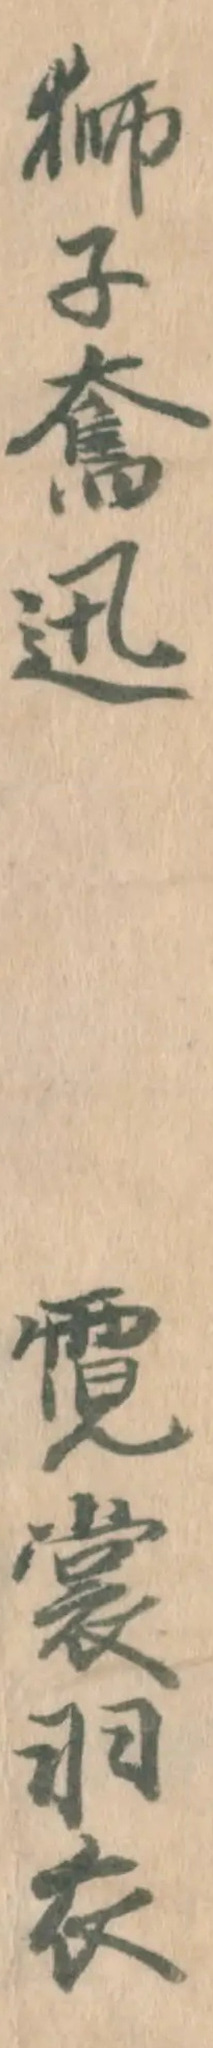獅子奮迅霓裳羽衣

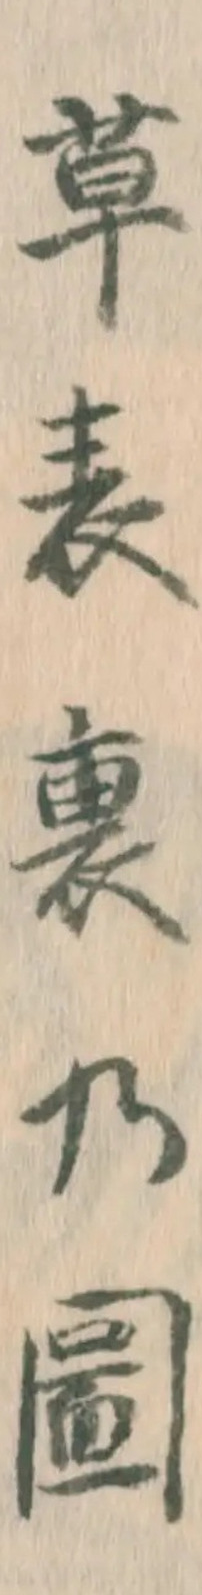草表裏の図
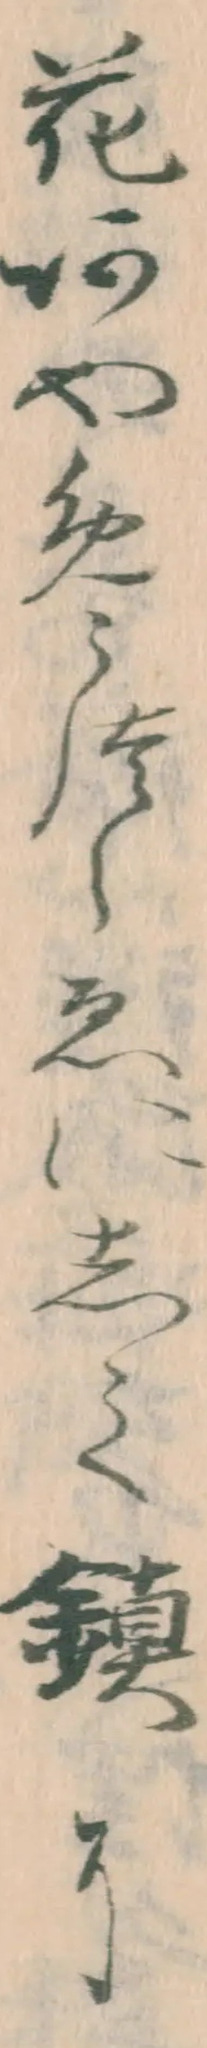花あやめうつしえにして鎮に
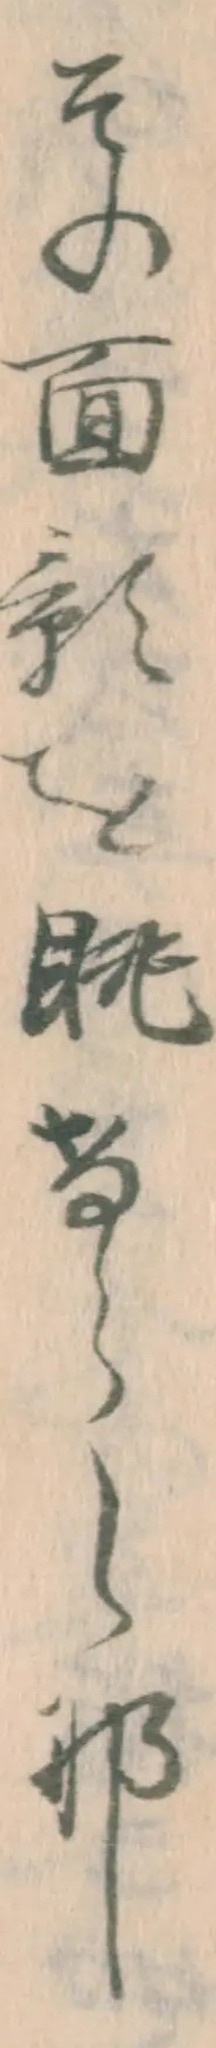その面影を眺ならしや
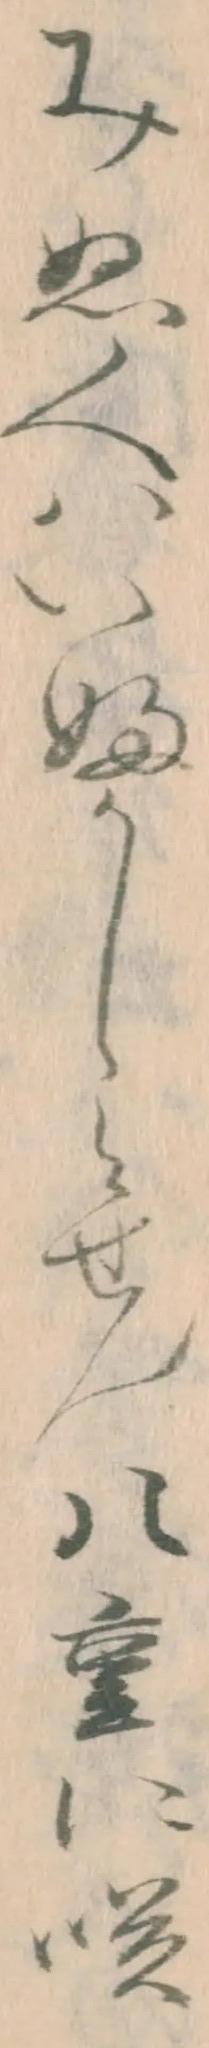みぬ人ハいふかしとせん八重に咲
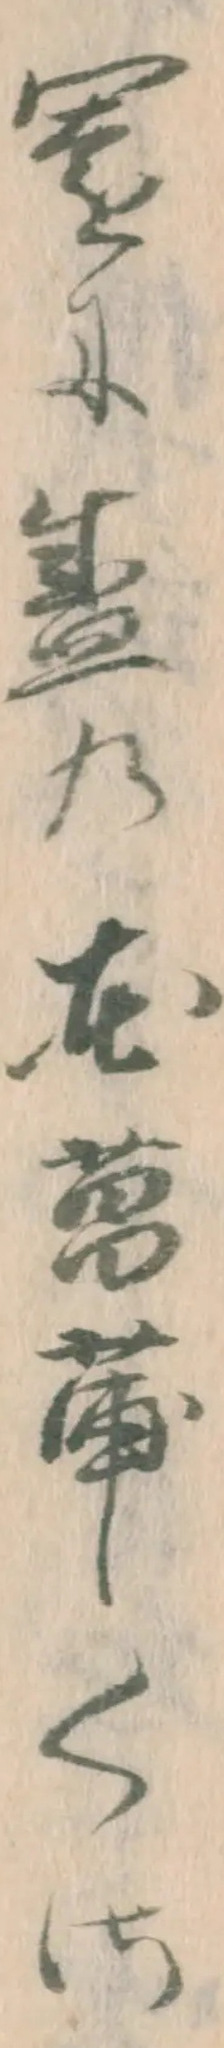岡に盛の花菖蒲くさ
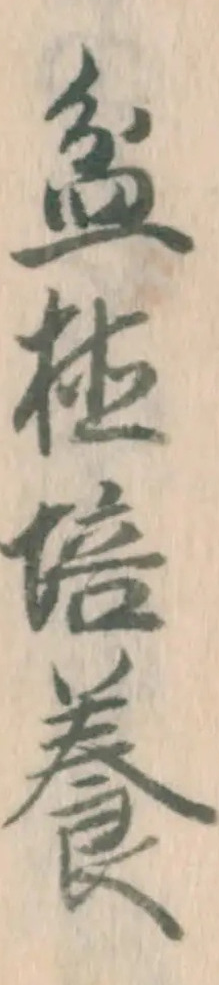盆植培養
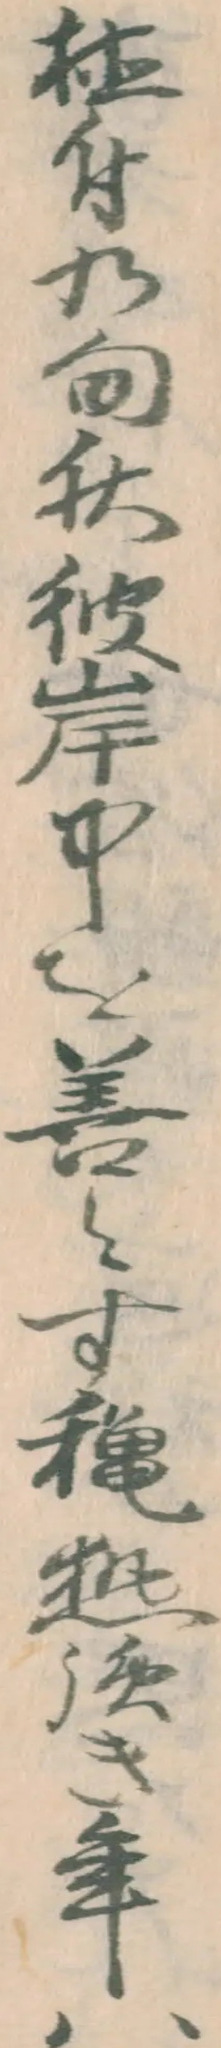植付の旬秋彼岸中を善とす秋愁強き年ハ
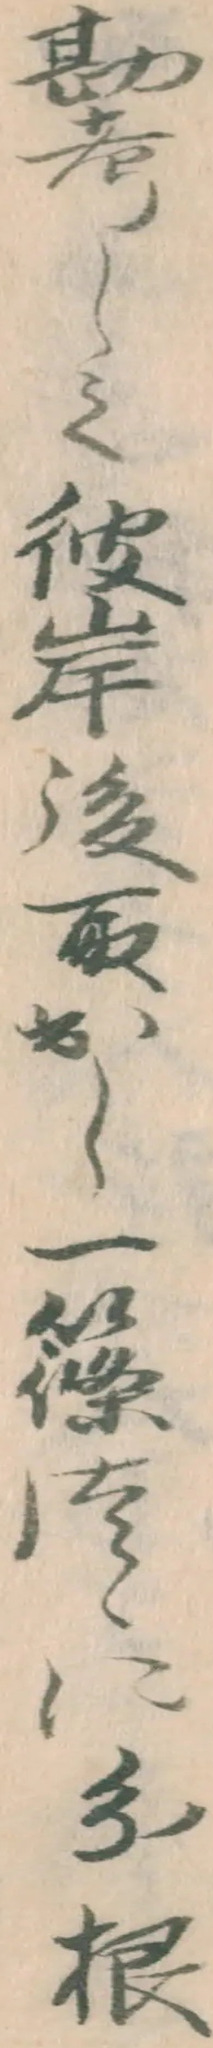勘考して彼岸後取出し一篠つゝに分根
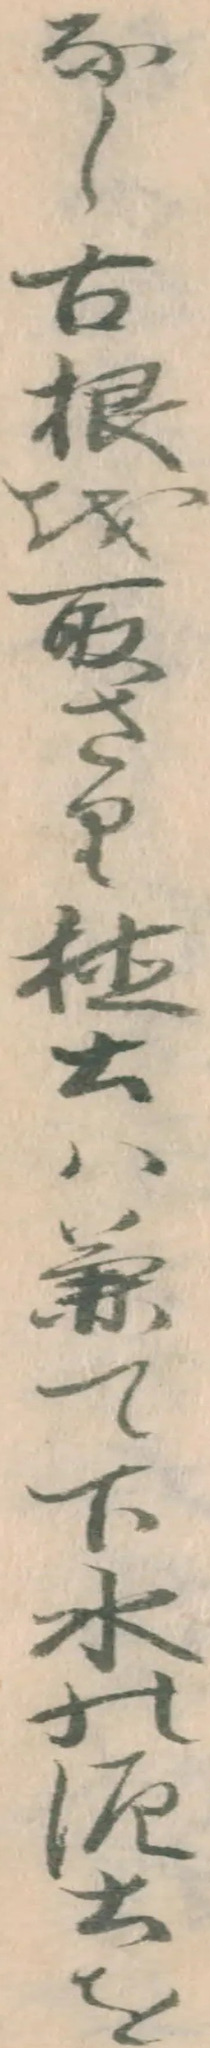なし古根を取さり植土は兼て下水の伌土を
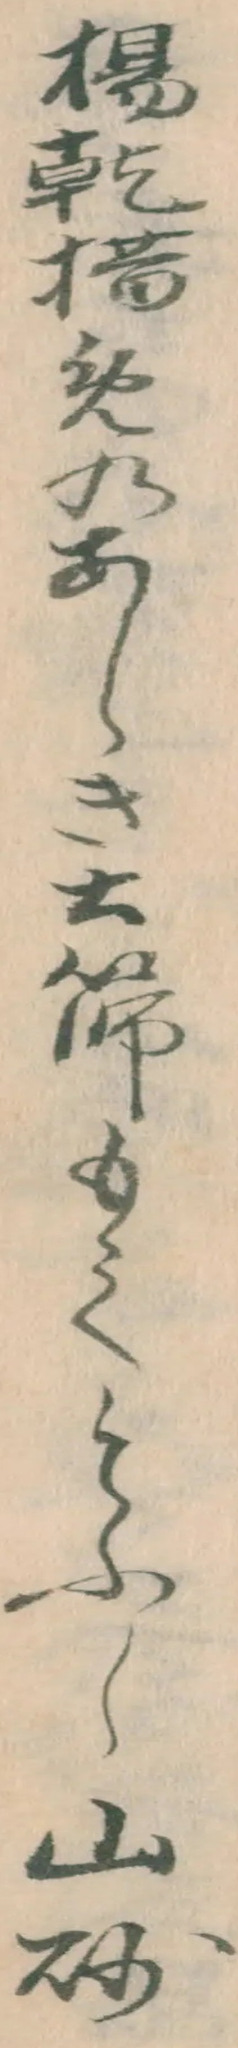揚乾措めのあしき土篩もてとふし山砂

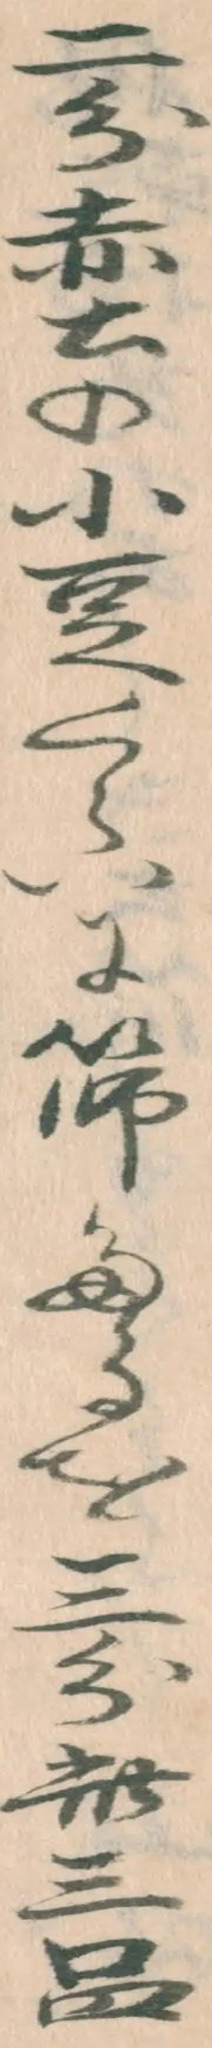二分赤土の小豆くらいに篩たるを三分此三品
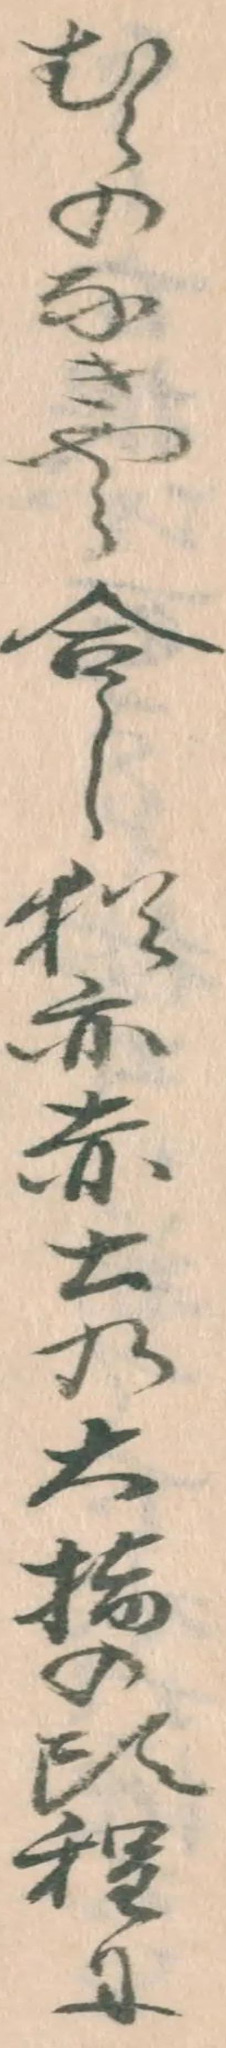むらのなきやう合し猶亦赤土の大指の頭程に
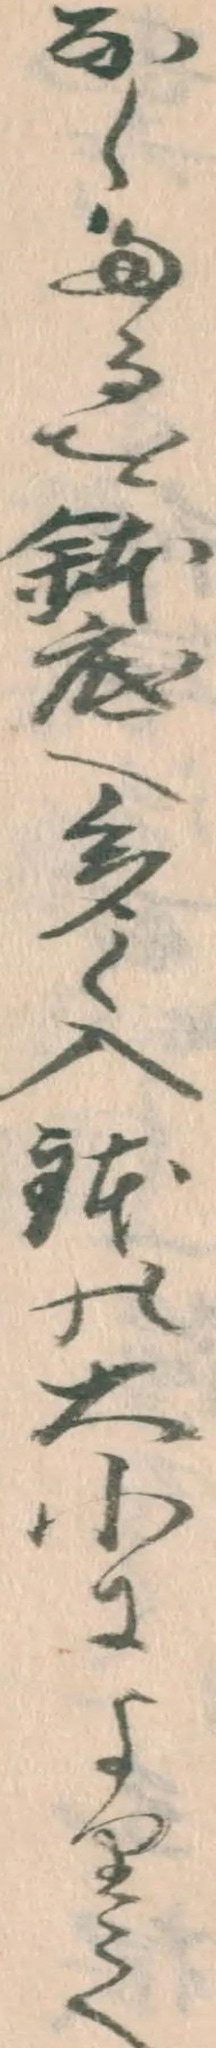なしたるを鉢底へ多く入鉢の大小によりて
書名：花菖培養録
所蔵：国立国会図書館 National Diet Library, JAPAN
